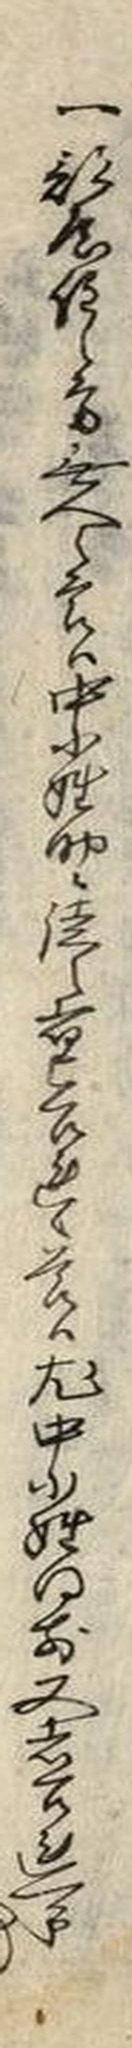一部屋住之方無人之節は中小姓助に徒之者被召連候節は尤も中小姓同前又者召連可申事
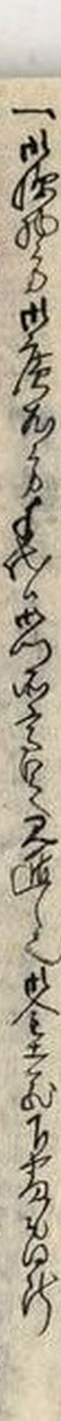一御腰物方御広敷方手代は御門所高足見遁候也御金土蔵下番も同断
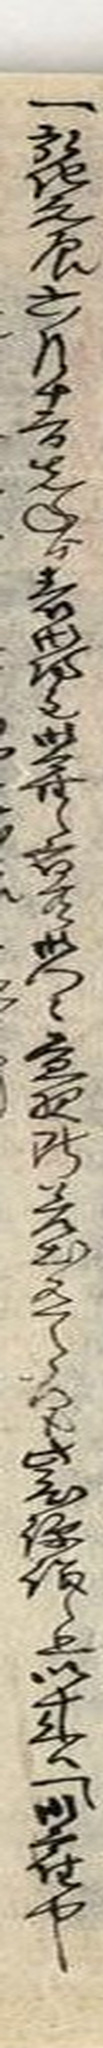一弘化元辰六月十二日先年ゟ表御坊主御雇之者共御門に昼夜断差出有之候得共此度評議之上以来は「御雇中
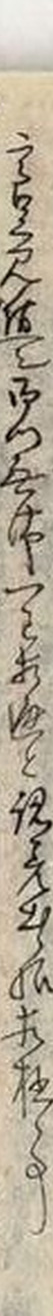高足見遁し御門無滞可被相通と認差出候様相極候事
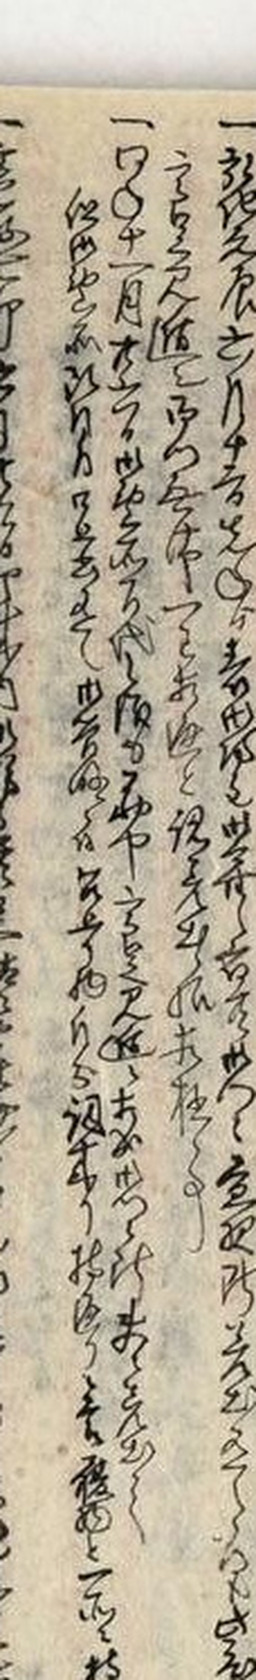一同年十一月廿六日御台所下代之儀も勤中高足見遁に相成御門へ断夫々差出之
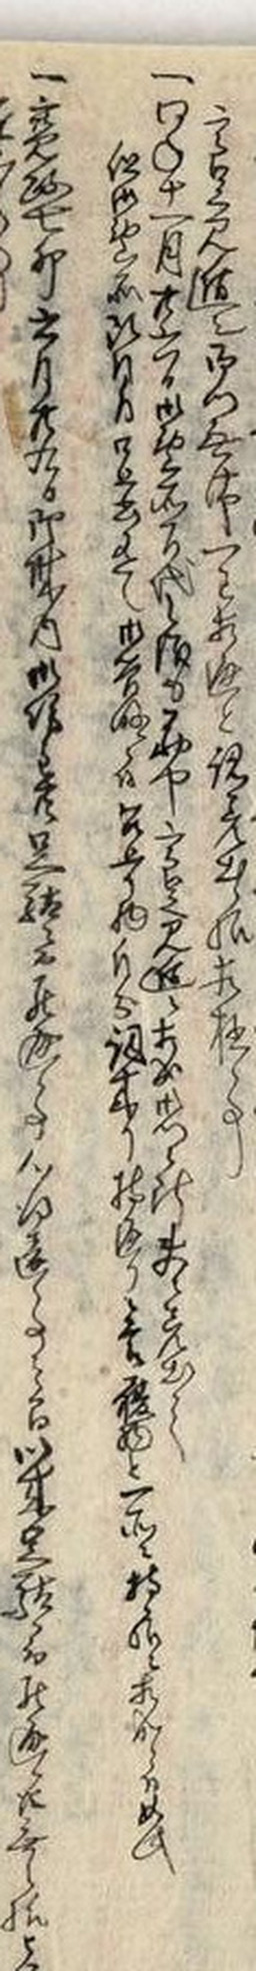但御台所頭目付口上書有之御簡略に付召上り物自分認来り持通り之節獲物と一所に持候様に相成候に付如此
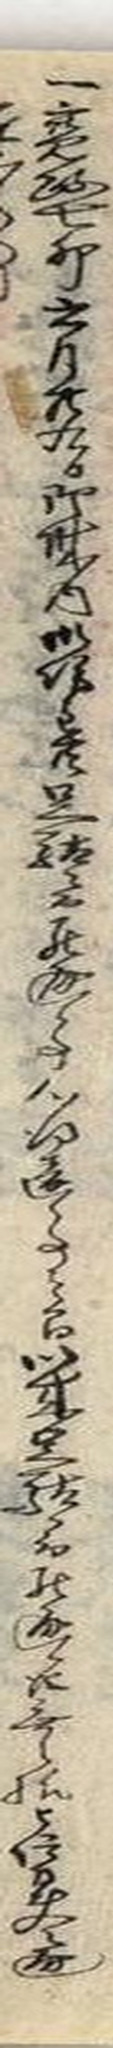一寛政七卯六月廿九日御城内御坊主共足駄に而罷通候事心得違候事に候間以来足駄に而罷通候儀無之様被仰付夫々通
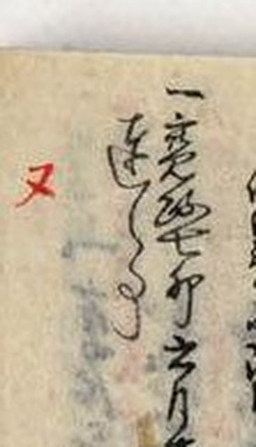達之事

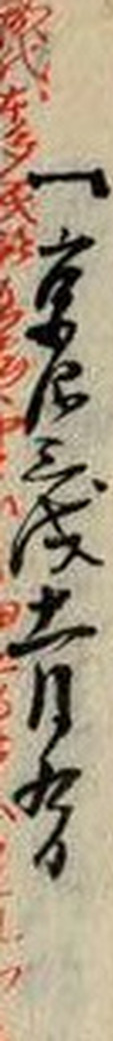一享保三戌十一月九日
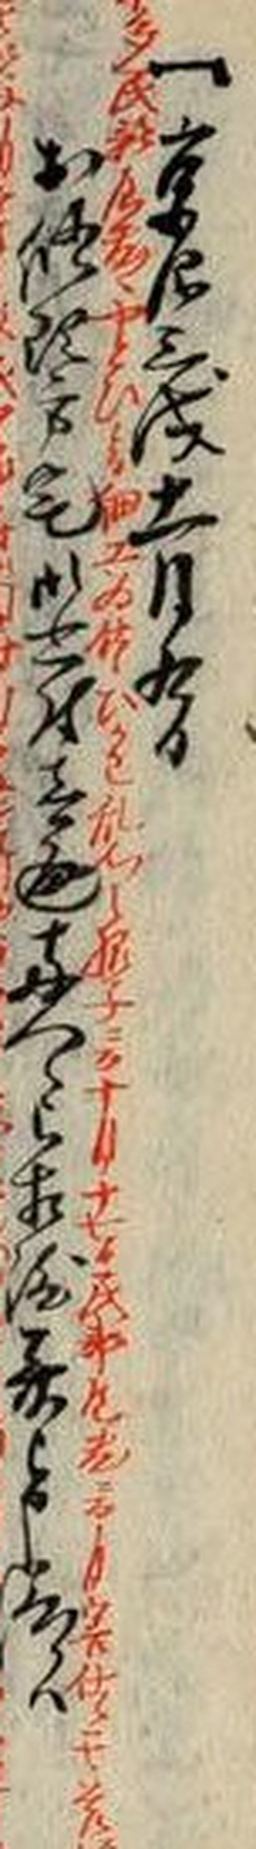於修理方宅御書付壱通両人へ被相渡并被申渡候は
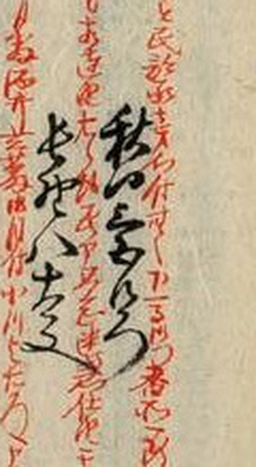秋田三五左衛門
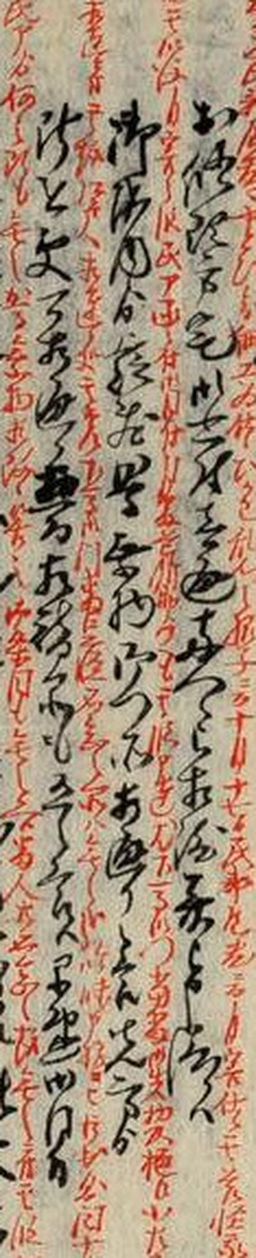御城内ゟ疑敷駕乗物御門所相通り候節先方ゟ
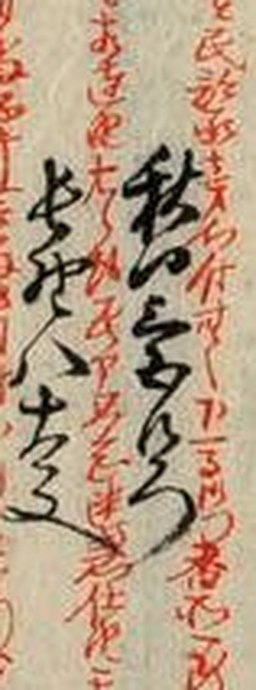長野八太夫
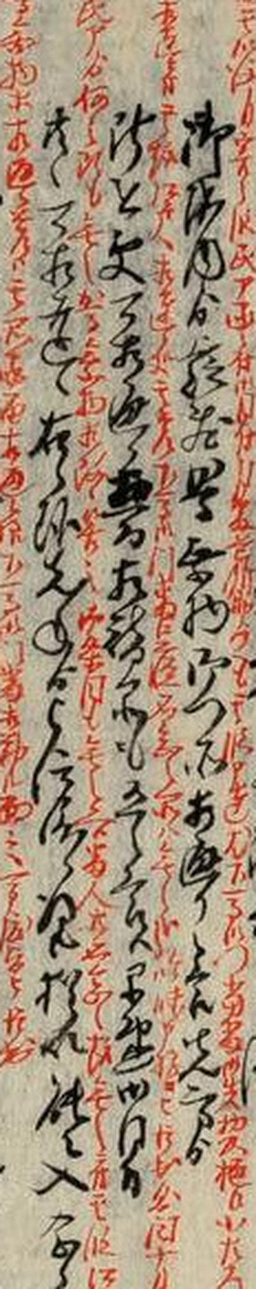断を受可相通候惣而相替候品も有之節は早速御目付
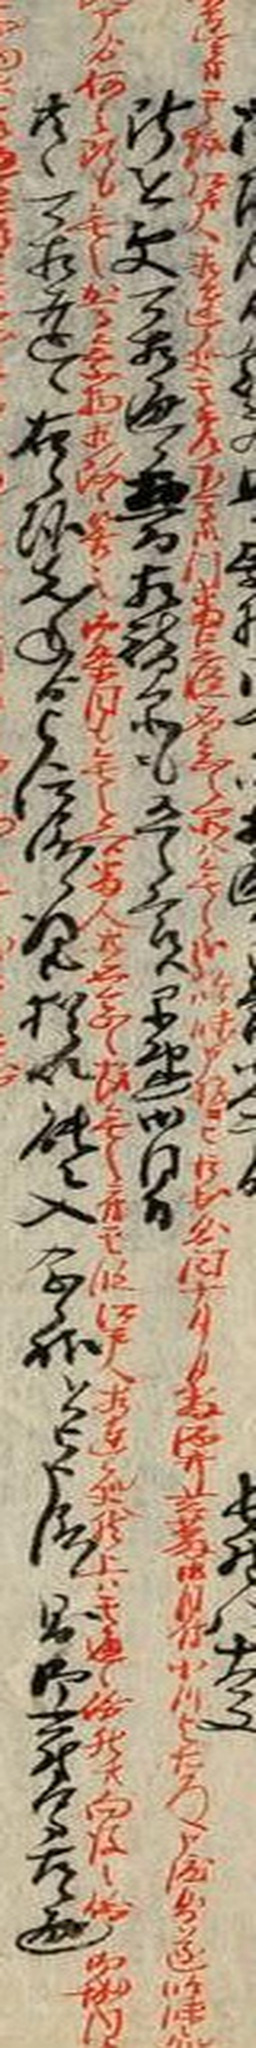共へ可相達候右之趣先年ゟ被仰渡候得共猶以能々入念候様と被申渡候則御書写左之通
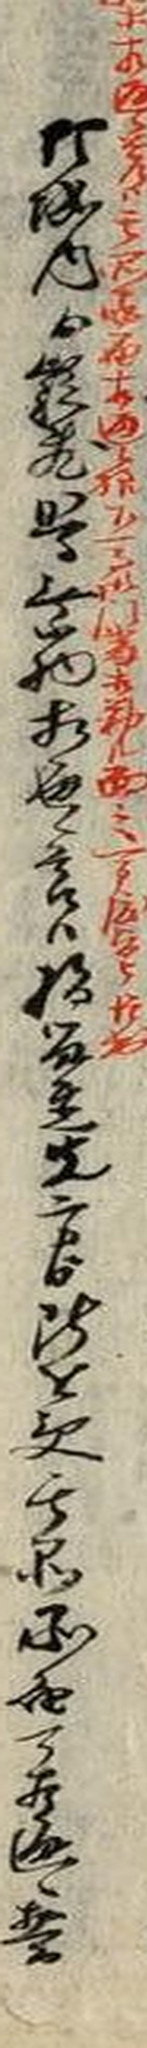御城内ゟ疑敷駕乗物相通候節は指留置先方ゟ断を受其品承届可相通候惣而
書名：御門御櫓之部
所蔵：福井県文書館 Fukui Prefectural Archives
